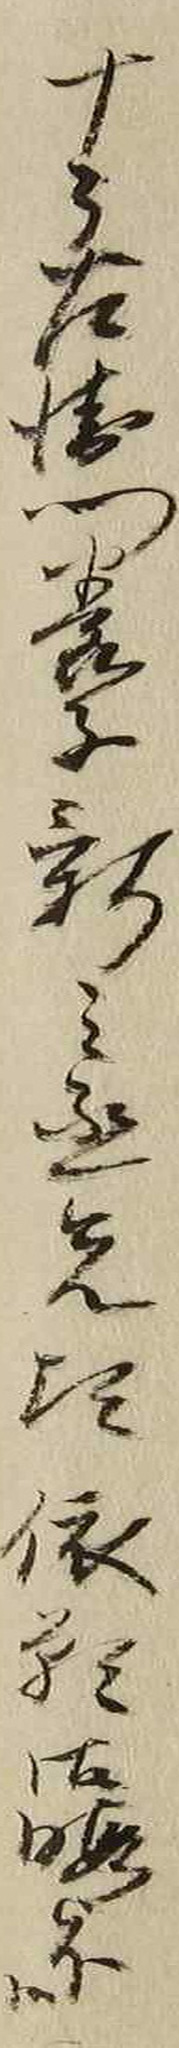十郎左衛門養子新之丞先頃依願御暇被下候
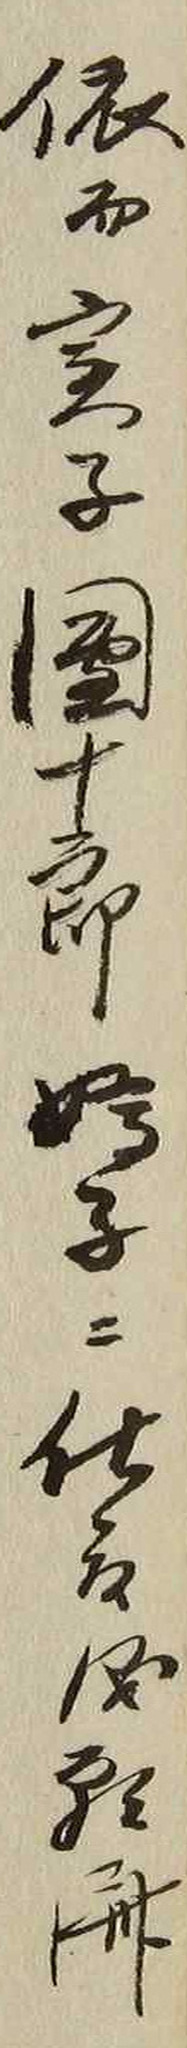依而実子団十郎嫡子ニ仕度儀願済
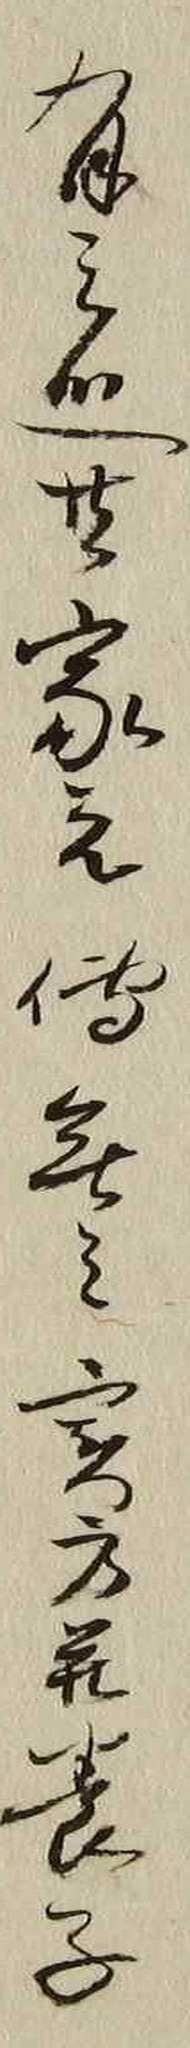有之候へ共家之伝無之実方并養子
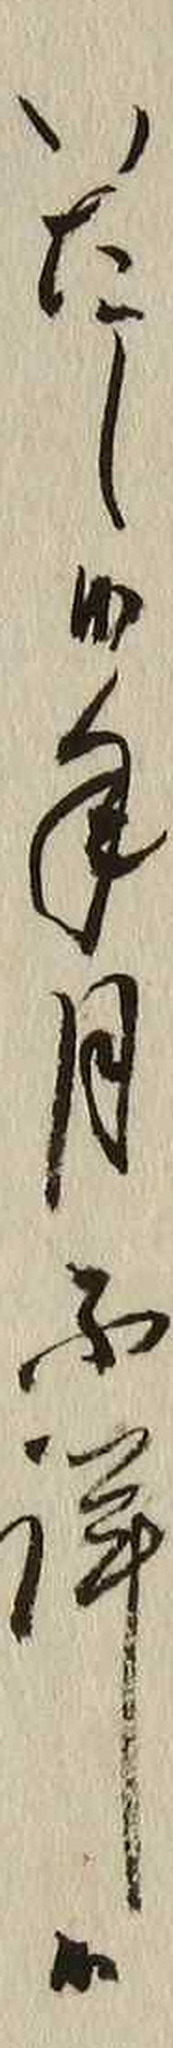いたし候年月不詳候
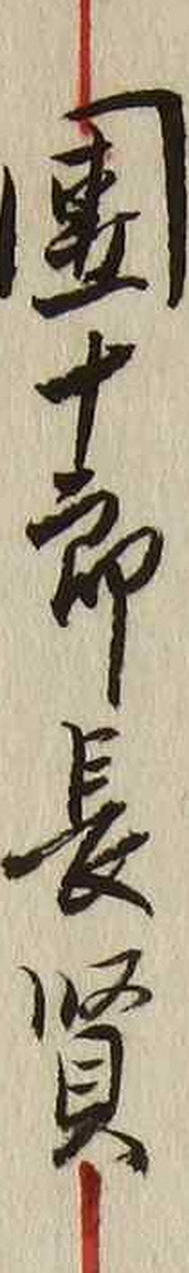団十郎長賢
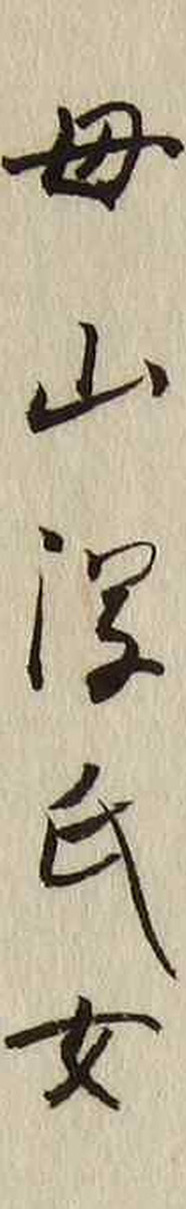母山潟氏女
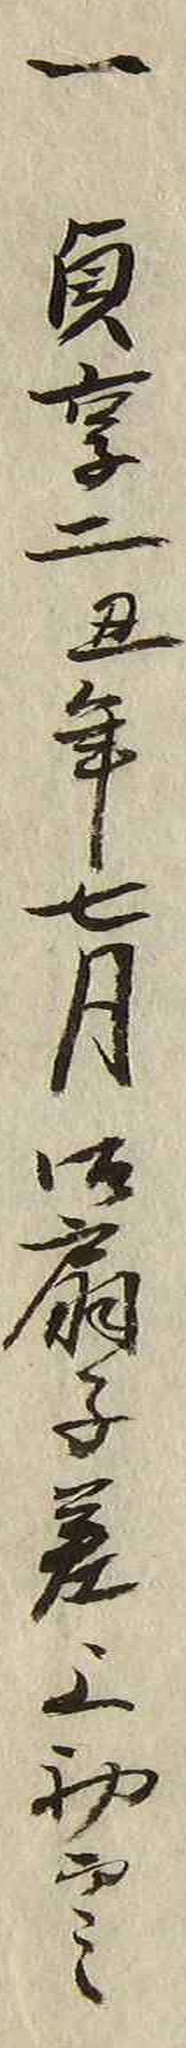一貞享二丑年七月御扇子差上初而之
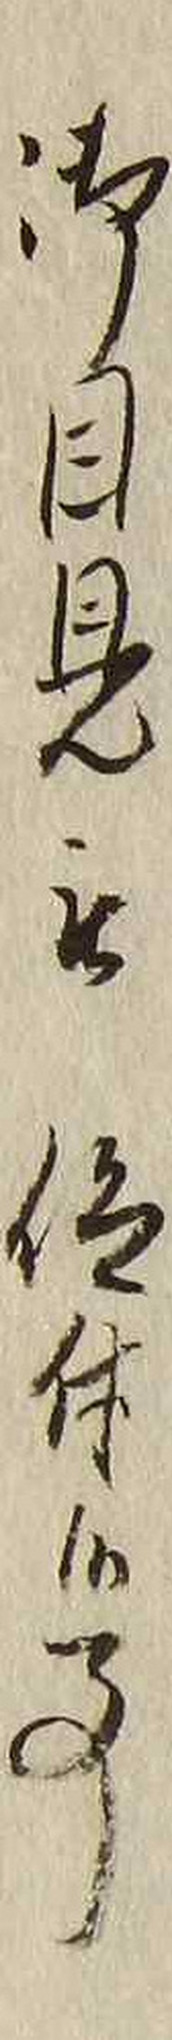御目見被仰付候事

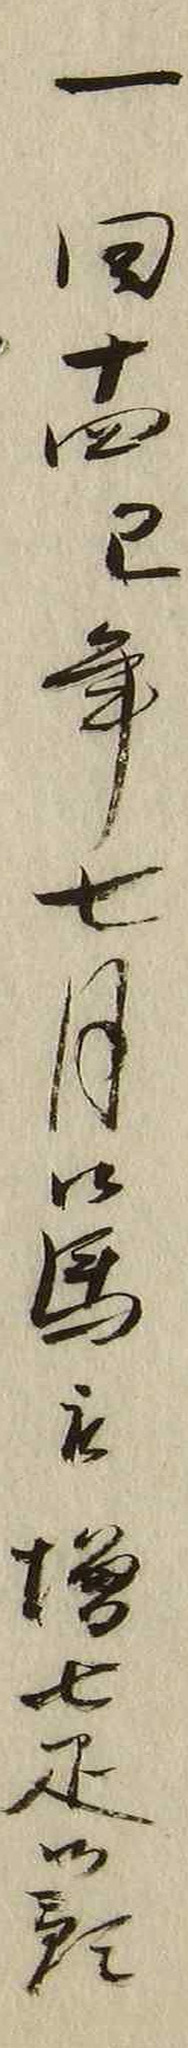一同十四巳年七月御馬被増七疋御預
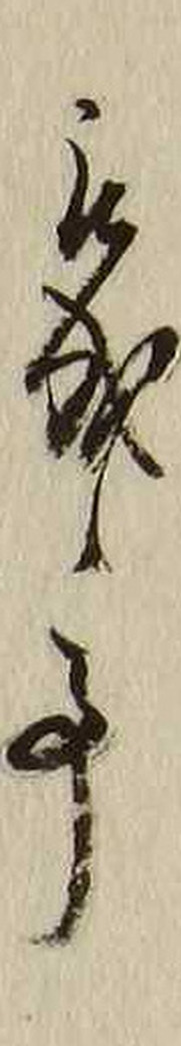被成候事
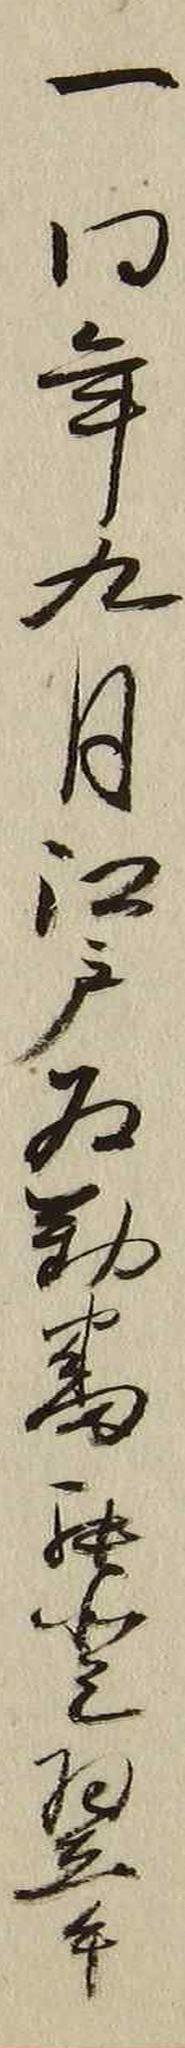一同年九月江戸為勤番罷登翌午
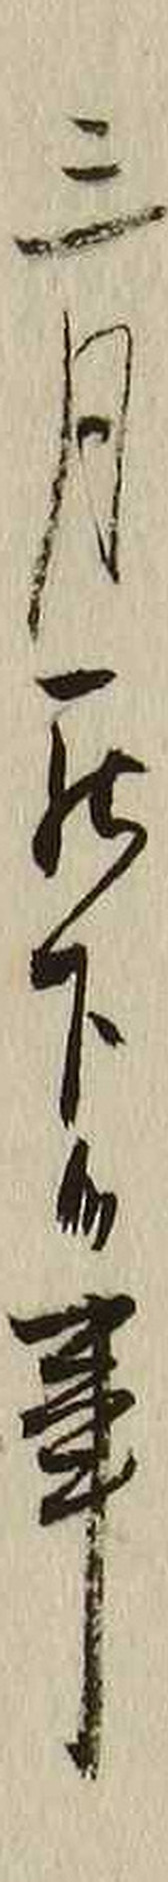三月罷下候事
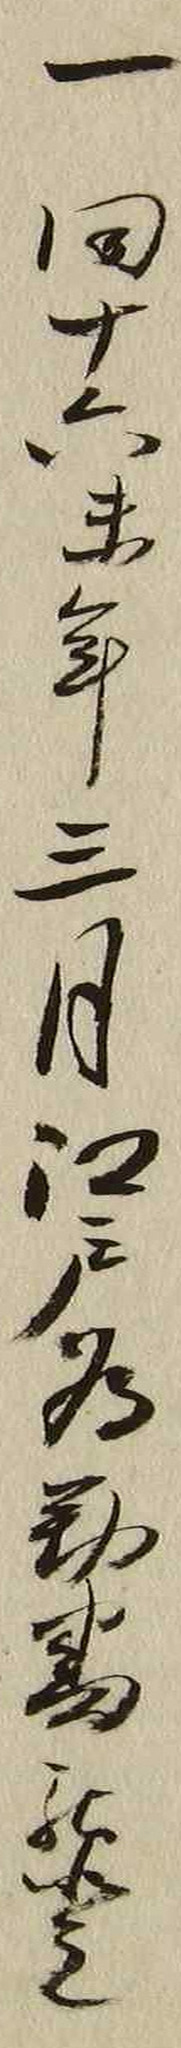一同十六未年三月江戸為勤番罷登
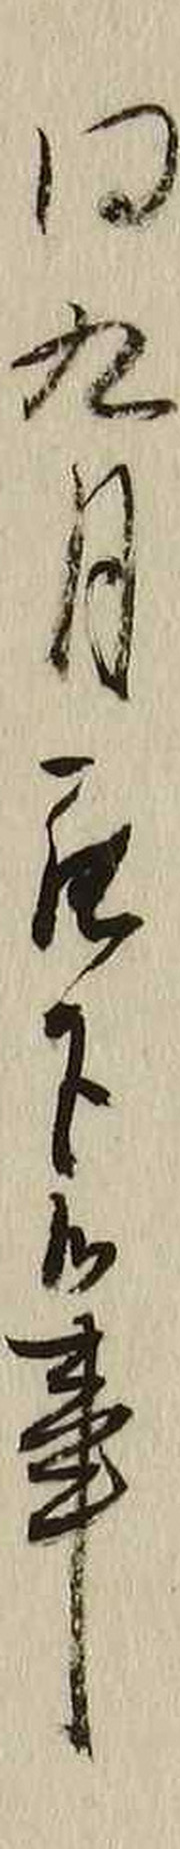同九月罷下候事
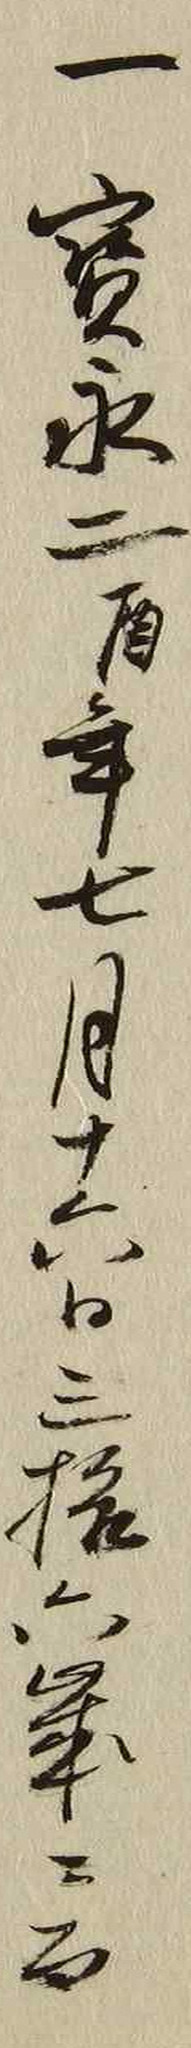一宝水二酉年七月十六日三拾六歳ニ而
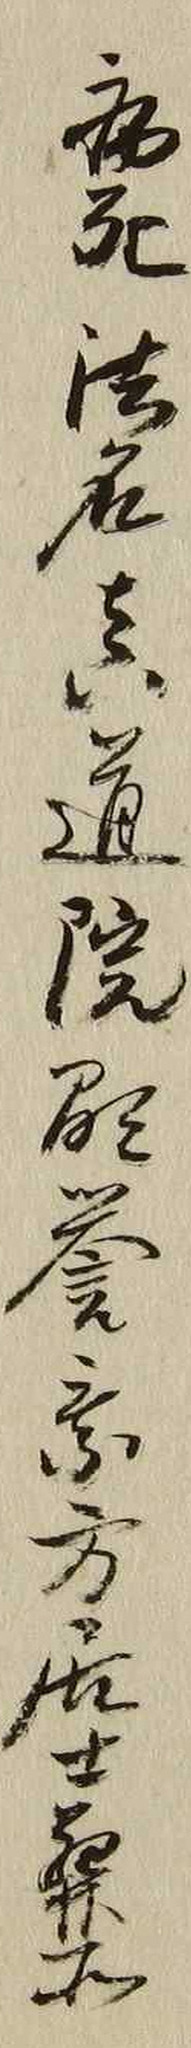病死法名真道院顕誉乗方居士葬所
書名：諸士系譜　巻之345　も之部1
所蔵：会津若松市立会津図書館
